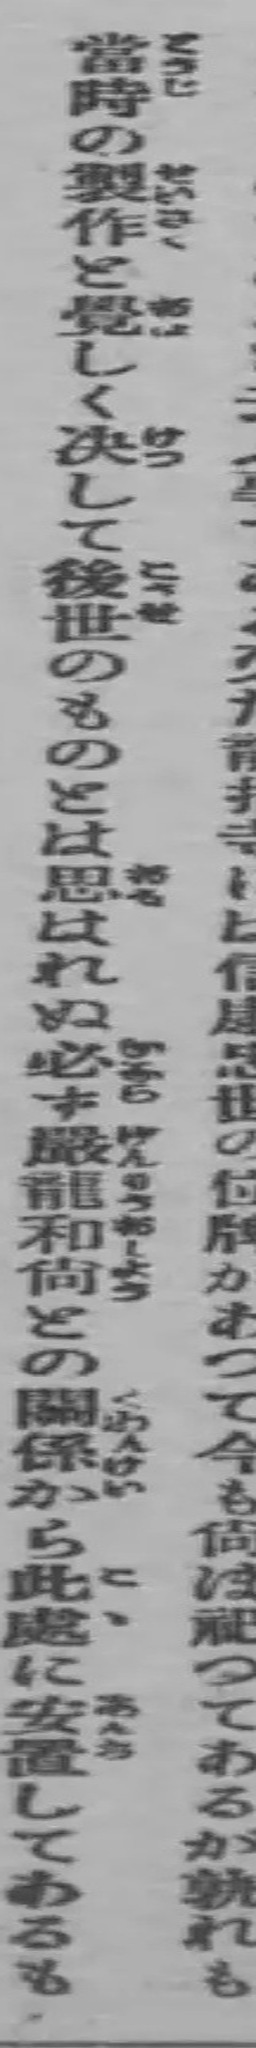当時の製作と覚しく決して後世のものとは思はれぬ必ず厳龍和尚との関係から此処に安置してあるも
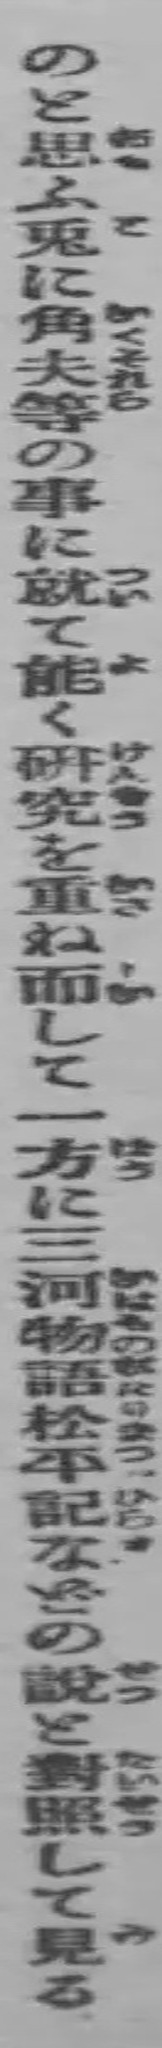のと思ふ兎に角夫等の事に就て能く研究を重ね而して一方に三河物語松平記などの説と対照して見る
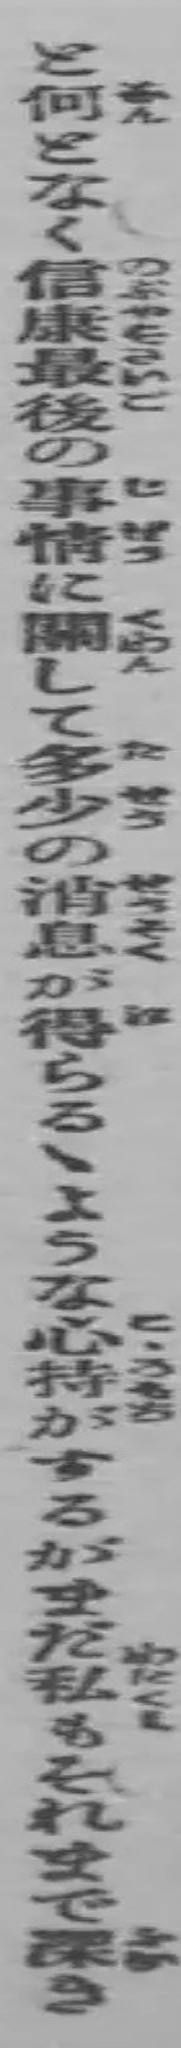と何となく信康最後の事情に関して多少の消息が得らるゝような心持がするがまだ私もそれまで深き
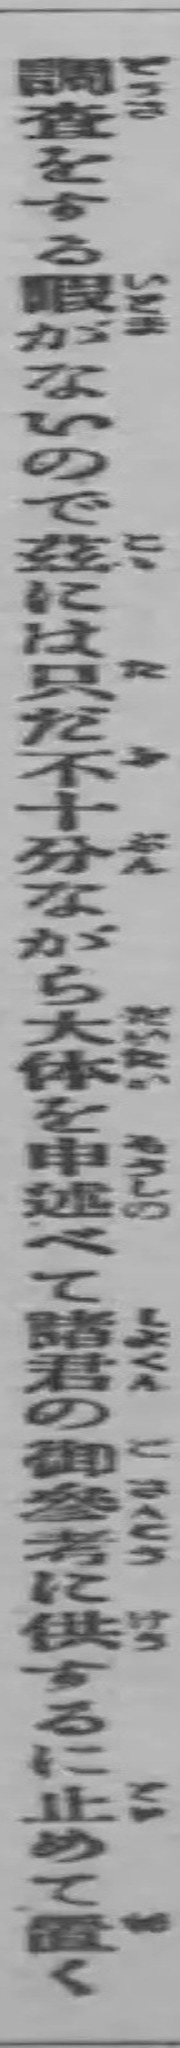調査をする暇がないので茲には只だ不十分ながら大体を申述べて諸君の御参考に供するに止めて置く
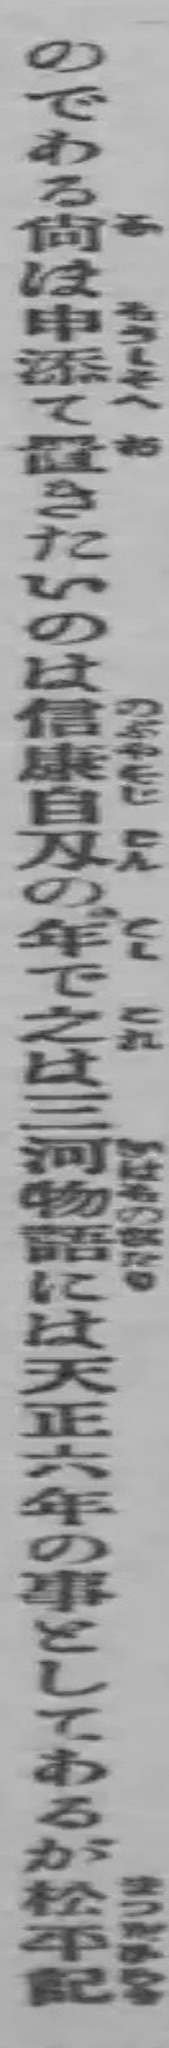のである尚ほ申添て置きたいのは信康自刃の年で之は三河物語には天正六年の事としてあるが松平記
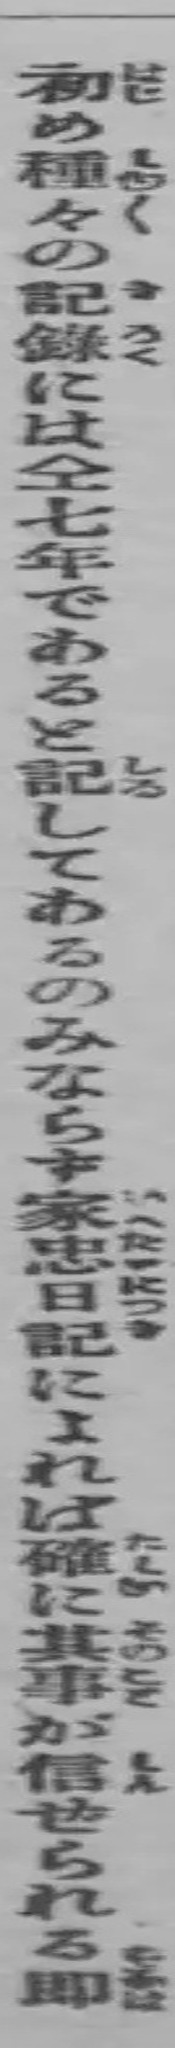初め種々の記録には仝七年であると記してあるのみならず家忠日記によれば確に其事が信ぜられる即
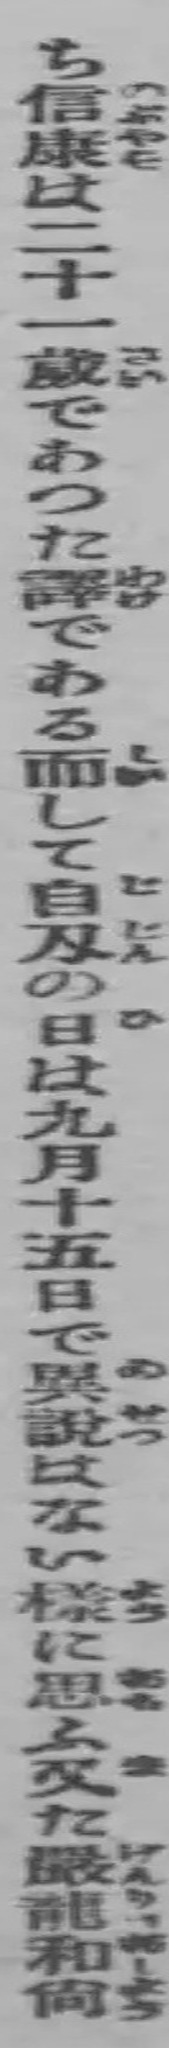ち信康は二十一歳であつた訳である而して自刃の日は九月十五日で異説はない様に思ふ又た厳龍和尚
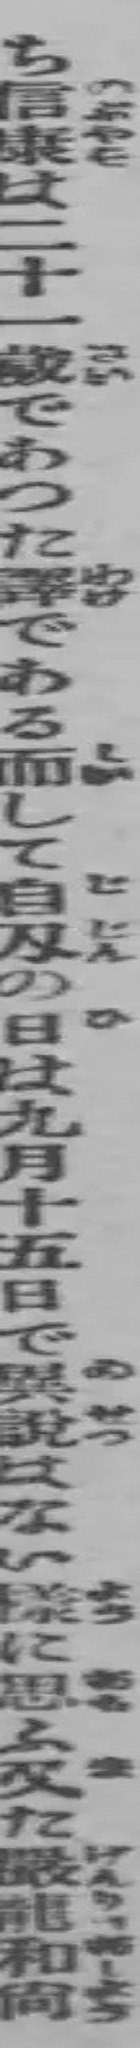ち信康は二十一歳であつた訳である而して自刃の日は九月十五日で異説はない様に思ふ又た厳龍和尚
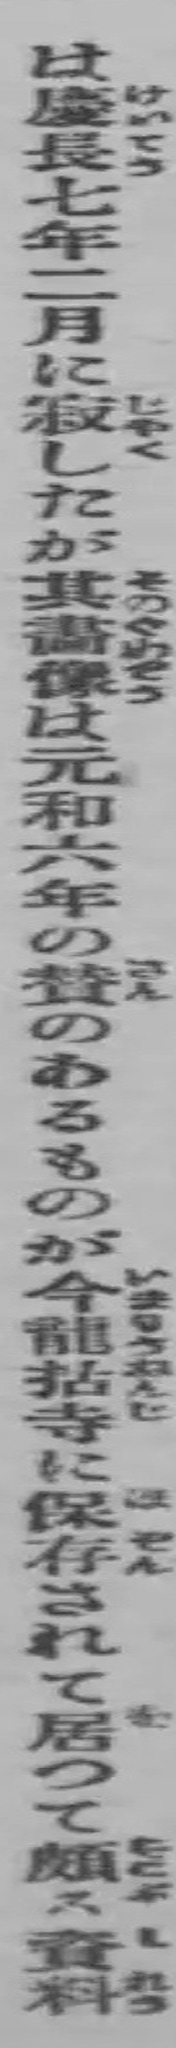は慶長七年二月に寂したが其画像は元和六年の賛のあるものが今龍拈寺に保存されて居つて頗る資料
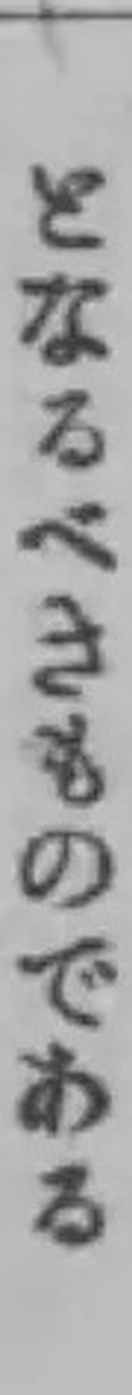となるべきものである
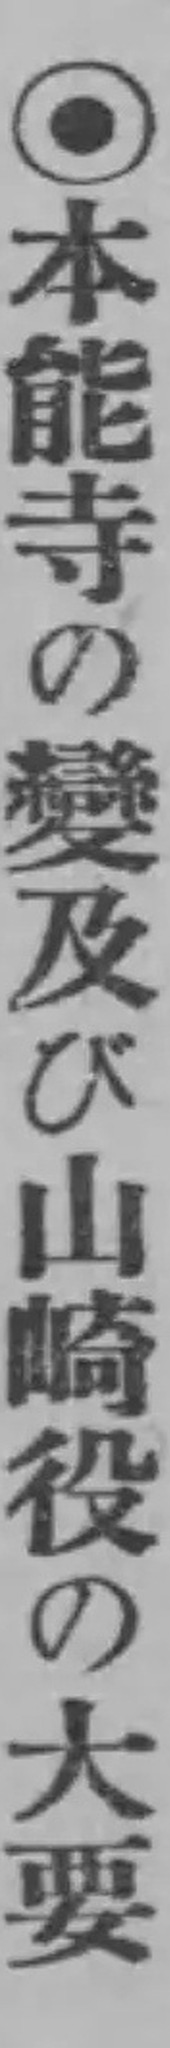⦿本能寺の変及び山崎役の大要
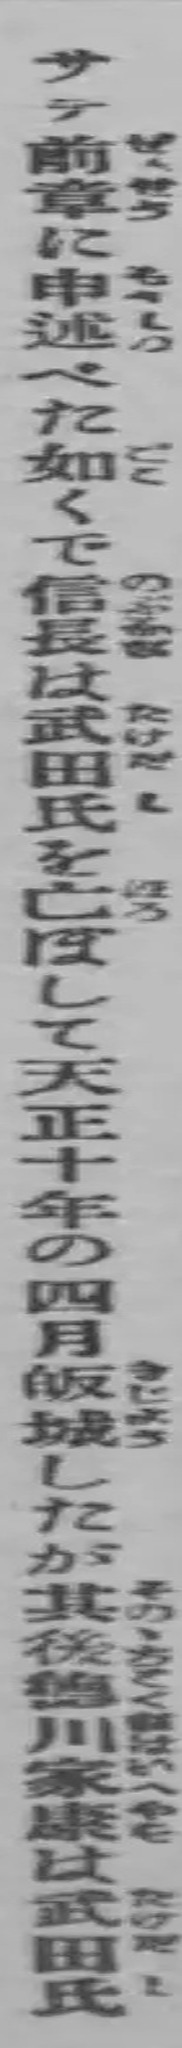サテ前章に申述べた如くで信長は武田氏を亡ぼして天正十年の四月皈城したが其後徳川家康は武田氏
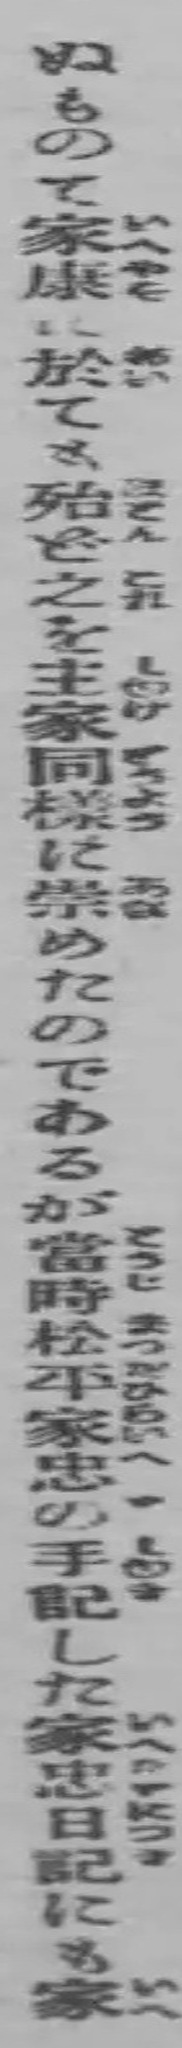信長の勢力ぬものて家康に於ても殆ど之を主家同様に崇めたのであるが当時松平家忠の手記した家忠日記にも家
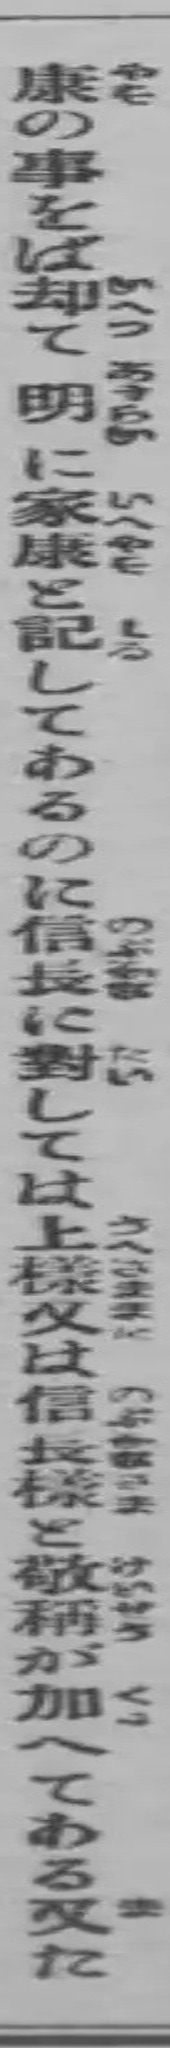康の事をば却て明に家康と記してあるのに信長に対しては上様又は信長様と敬称が加へてある又た
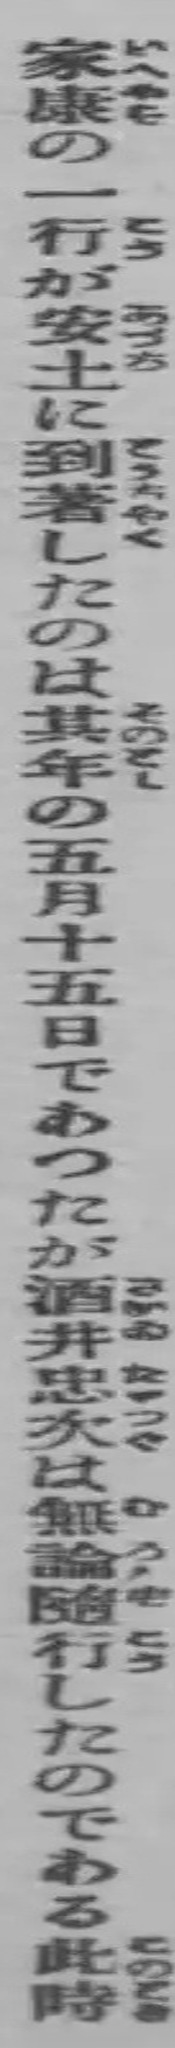家康の一行が安土に到着したのは其年の五月十五日であつたが酒井忠次は無論随行したのである此時
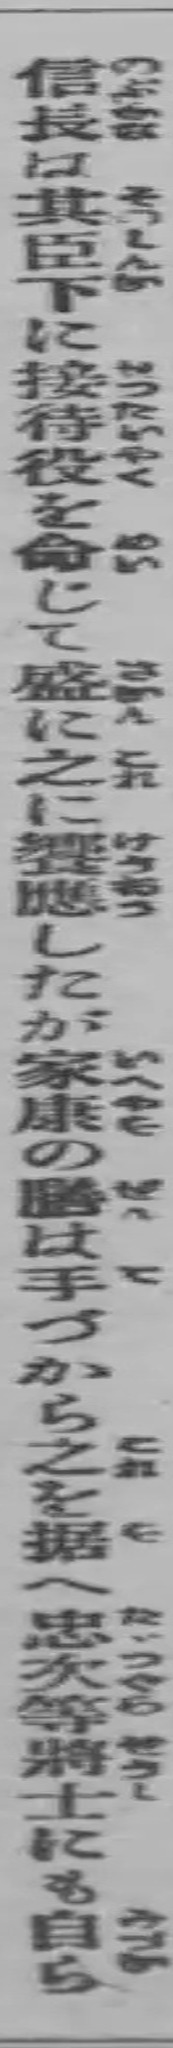信長は其臣下に接待役を命じて盛に之に饗応したが家康の膳は手づから之を据へ忠次等将士にも自ら
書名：豊橋市史談
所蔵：国立国会図書館 National Diet Library, JAPAN
